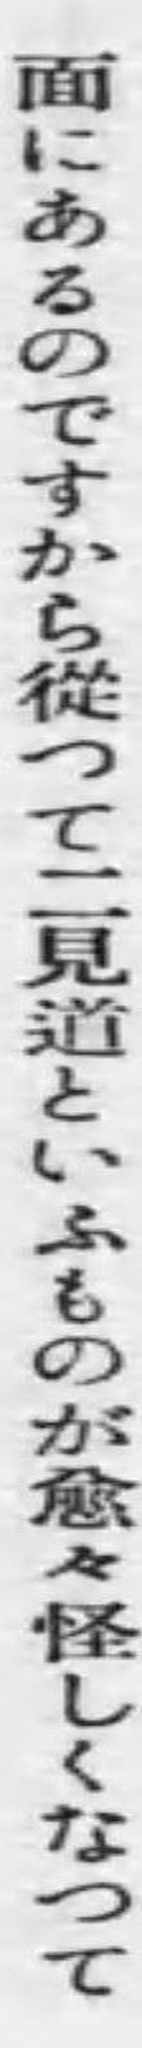面にあるのですから従つて二見道といふものが愈々怪しくなつて
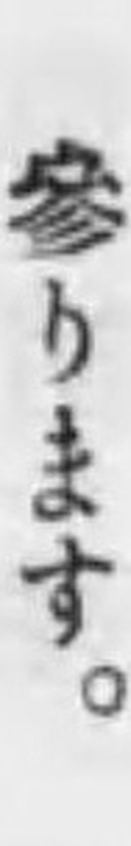参ります。
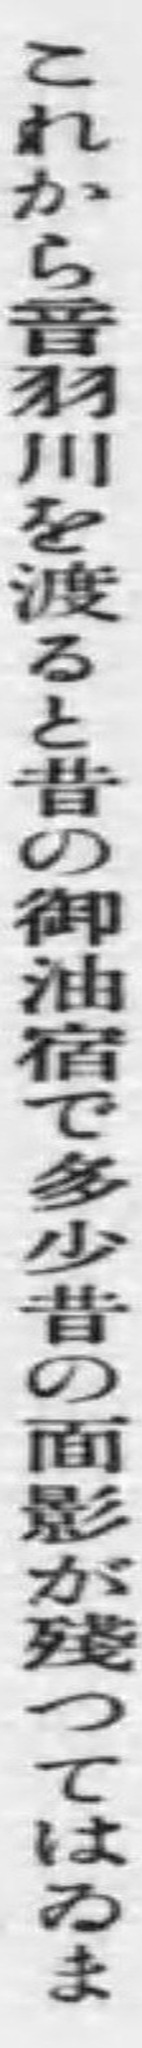これから音羽川を渡ると昔の御油宿で多少昔の面影が残つてはゐま
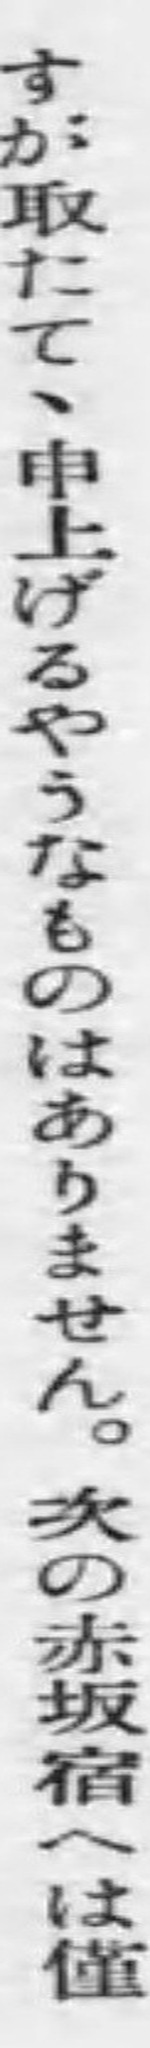すが取たてゝ申上げるやうなものはありません。次の赤坂宿へは僅
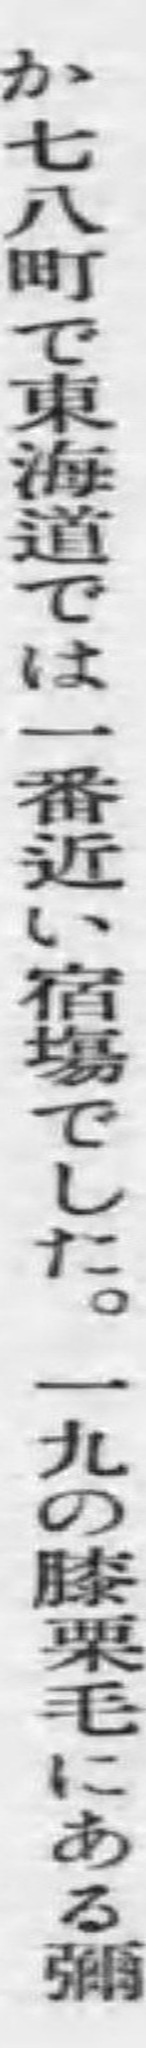か七八町で東海道では一番近い宿場でした。一九の膝栗毛にある弥
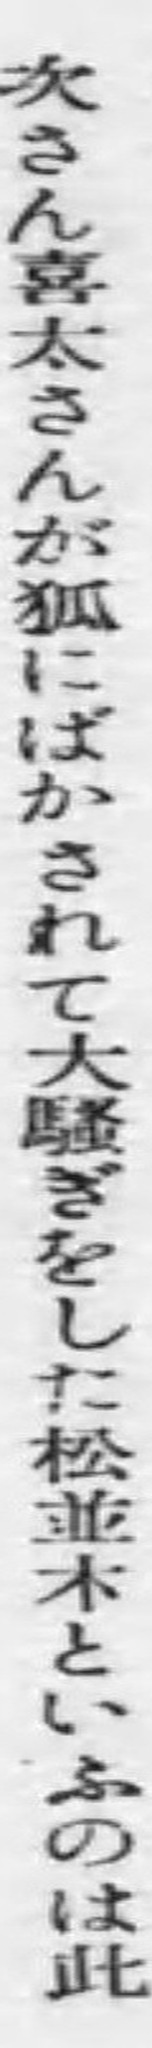次さん喜太さんが狐にばかされて大騒ぎをした松並木といふのは此
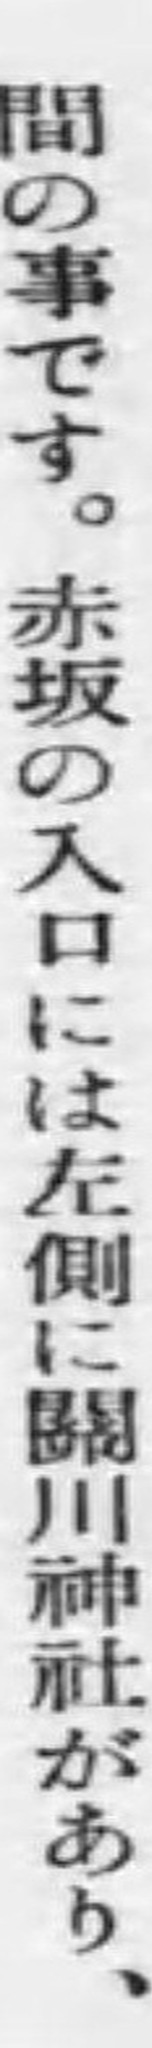間の事です。赤坂の入口には左側に関川神社があり、
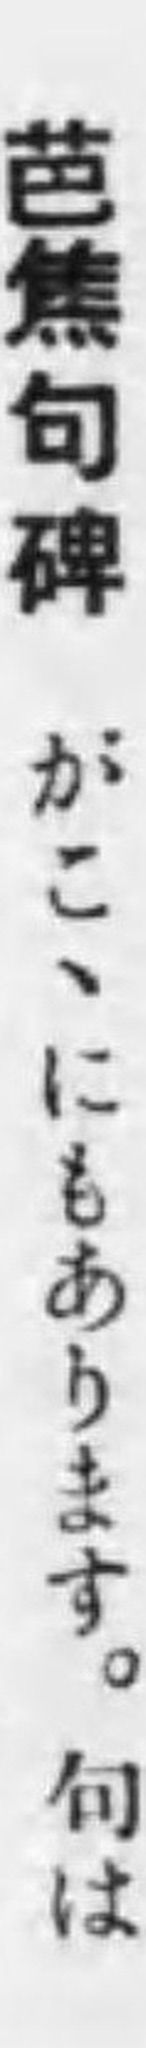芭蕉句碑がこゝにもあります。句は
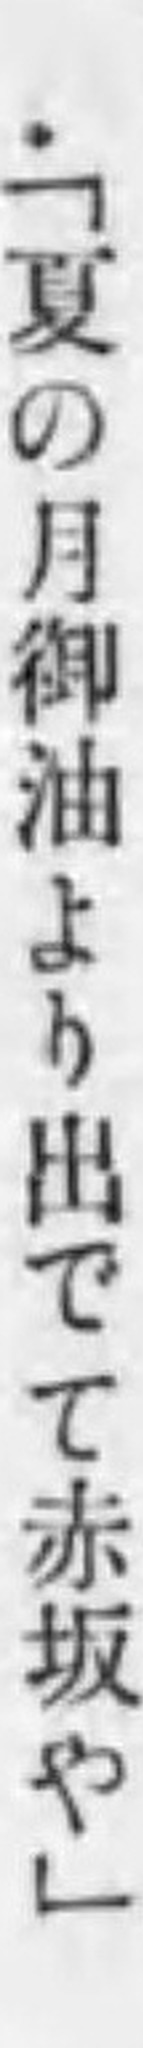「夏の月御油より出でて赤坂や」
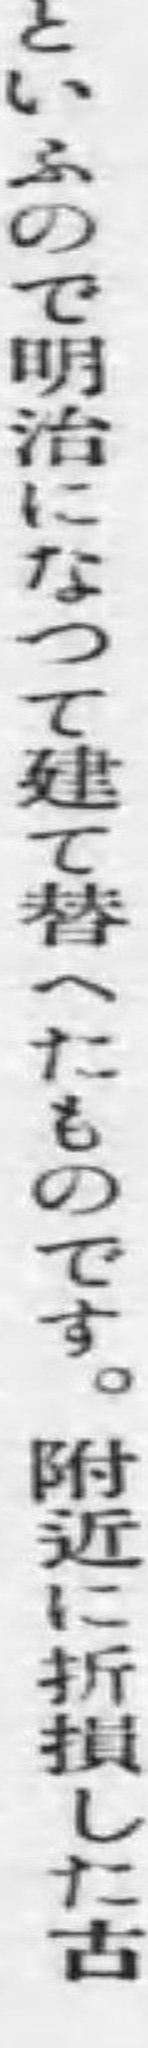といふので明治になつて建て替へたものです。附近に折損した古
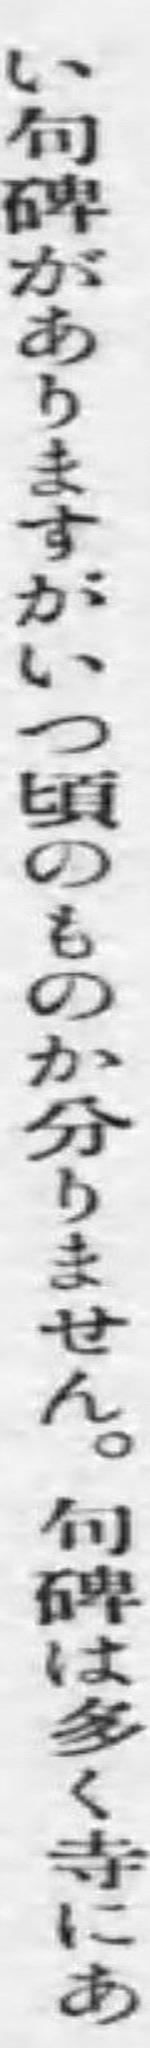い句碑がありますがいつ頃のものか分りません。句碑は多く寺にあ
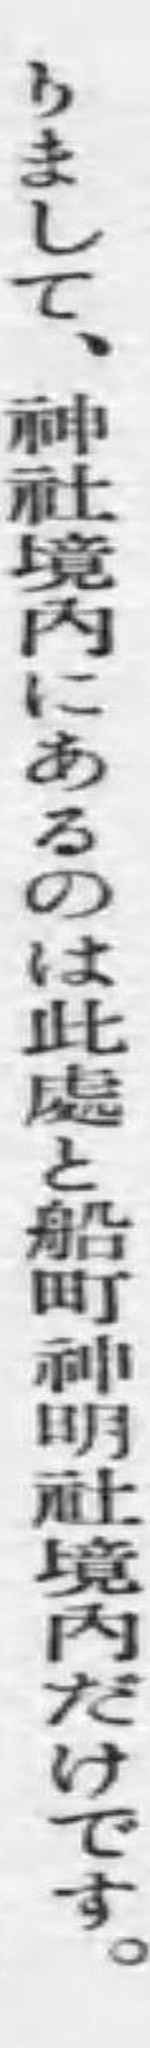りまして、神社境内にあるのは此処と船町神明社境内だけです。
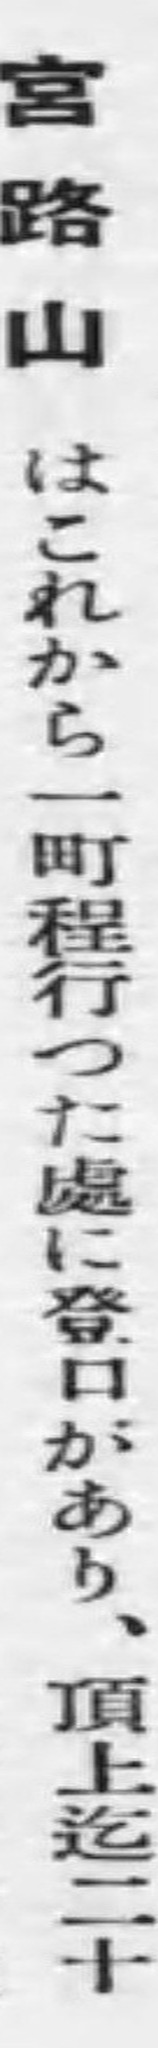宮路山はこれから一町程行つた処に登口があり、頂上迄二十
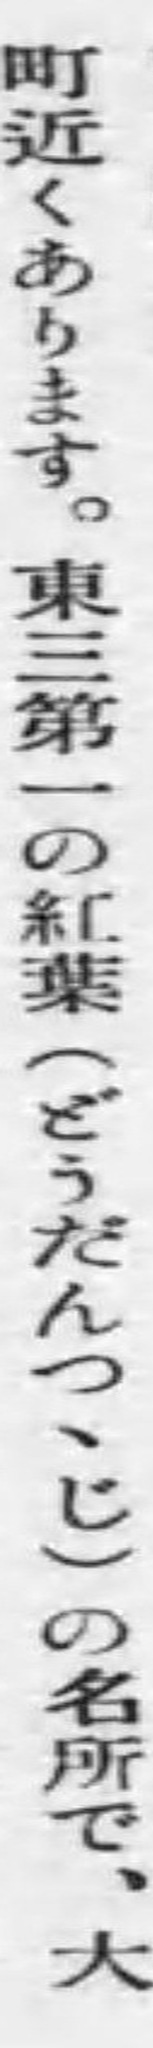町近くあります。東三第一の紅葉(どうだんつゝじ)の名所で、大
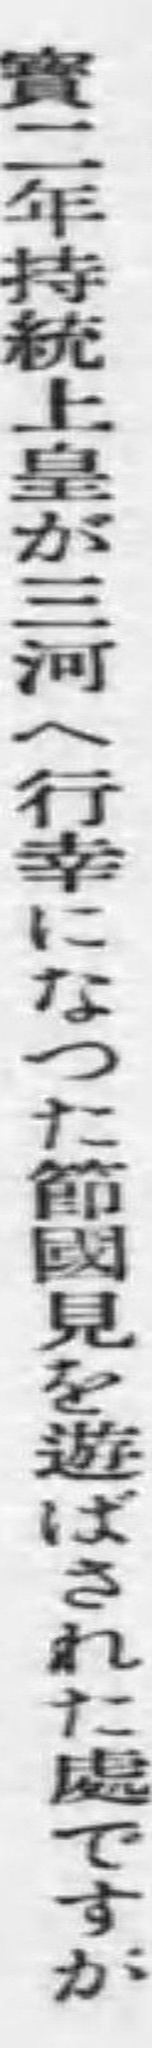宝二年持統上皇が三河へ行幸になつた節国見を遊ばされた処ですが
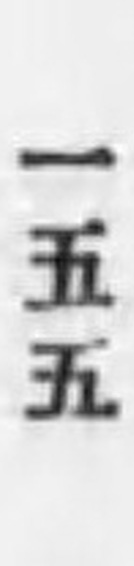一五五
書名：東三河道中記 : 豊橋市及其附近案内
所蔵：国立国会図書館 National Diet Library, JAPAN
